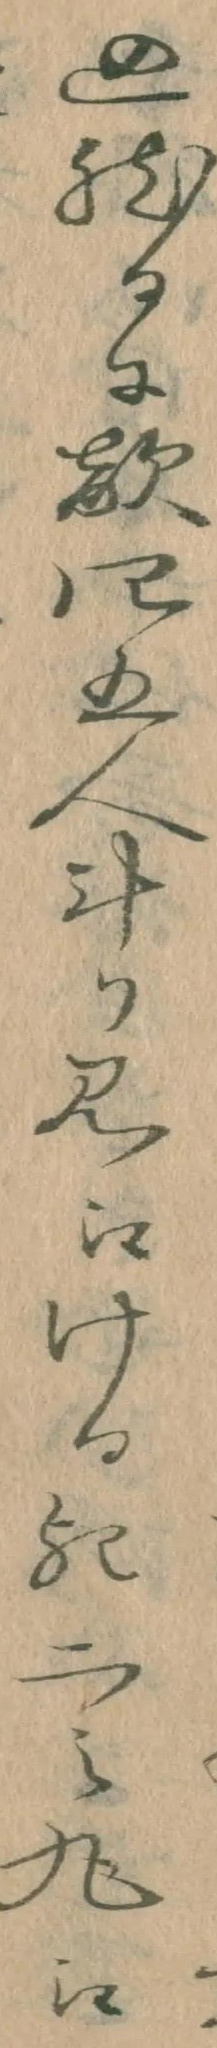込然る尓敵四五人斗り見江ける歟二之丸江
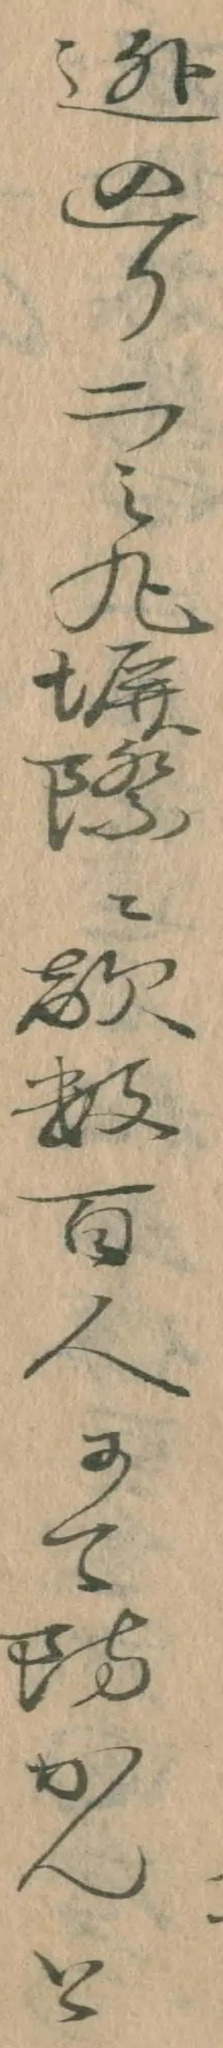逃込り二之丸塀際に敵数百人尓て防かんと
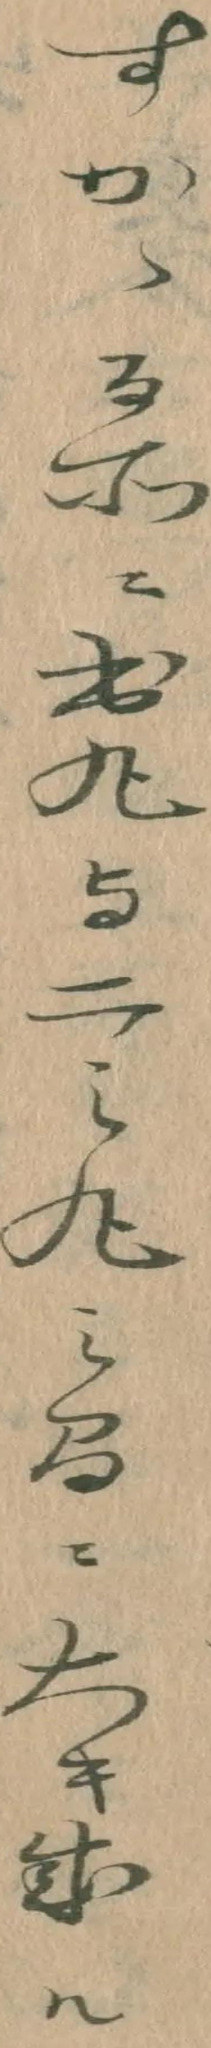すかゝる所に出丸与二之丸之間に大き成る
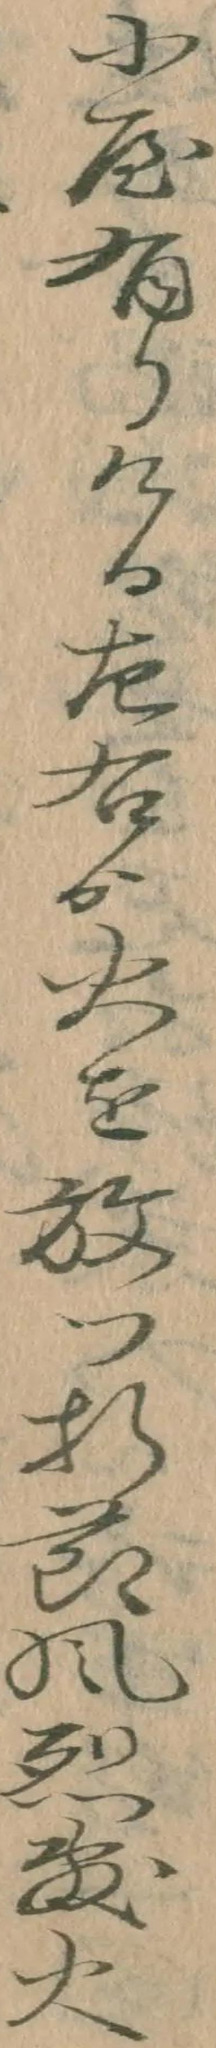小屋有りける左右ゟ火を放つ折節風烈敷火
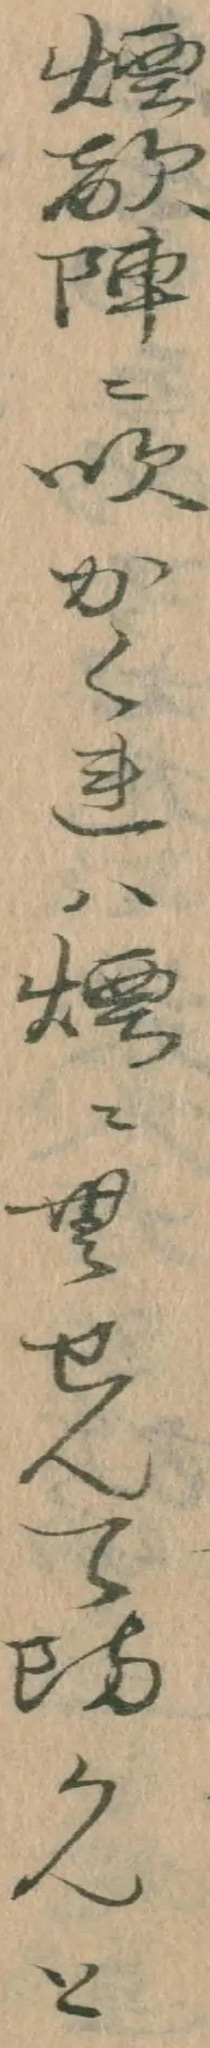煙敵陣に吹かく連は煙に無せんて防かんと
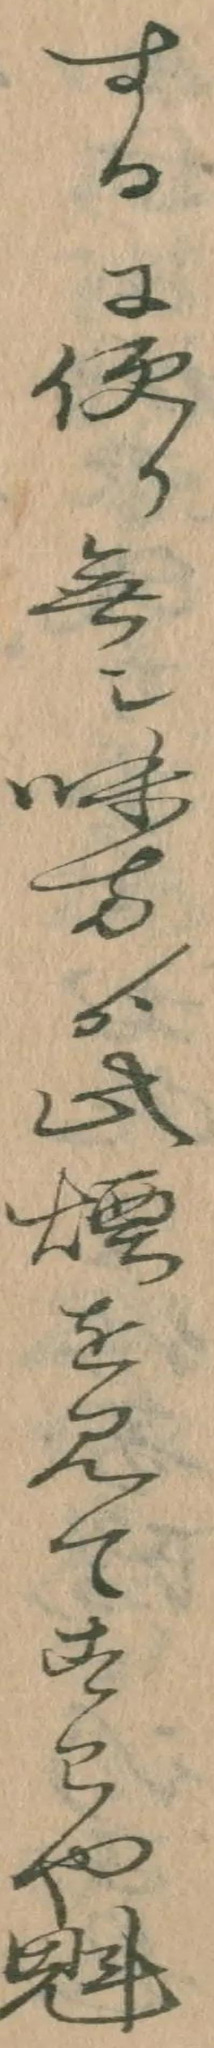する尓便り無し味方ゟ此煙を見て春巳や魁
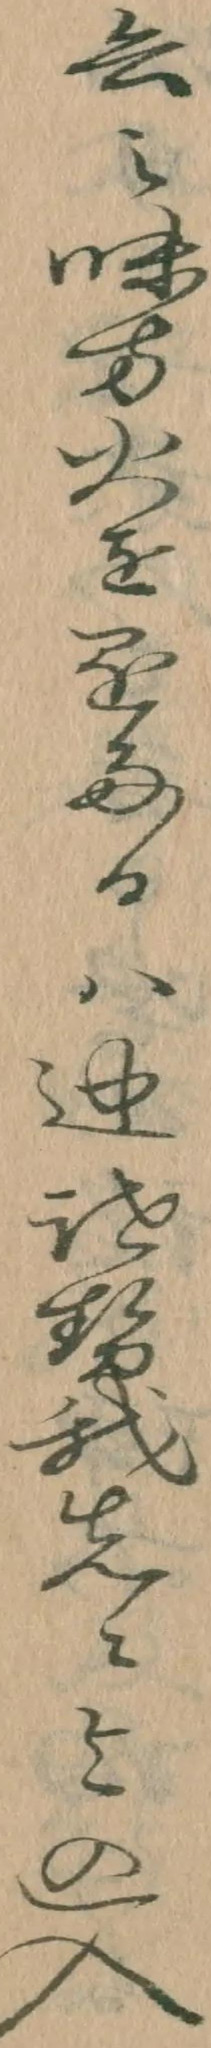兵之味方火を懸多るは迚諸勢我先に与込入
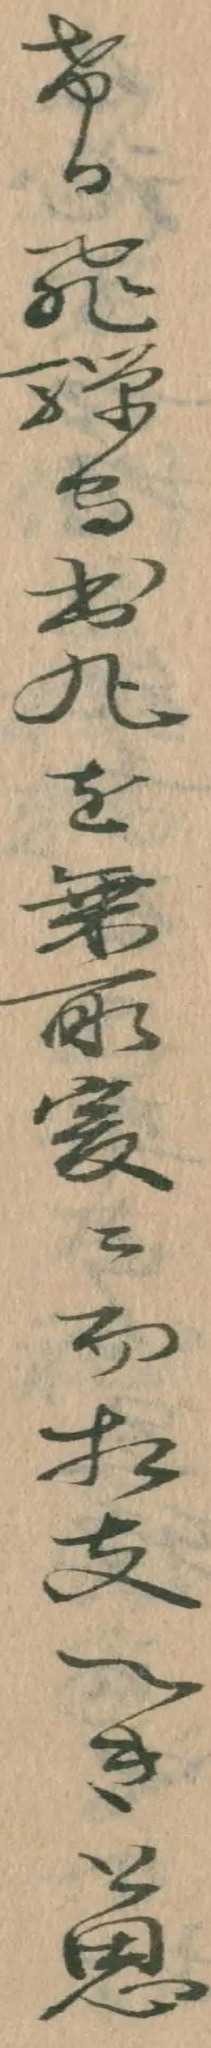希る飛騨守出丸を乗取爰に而相支へきと思
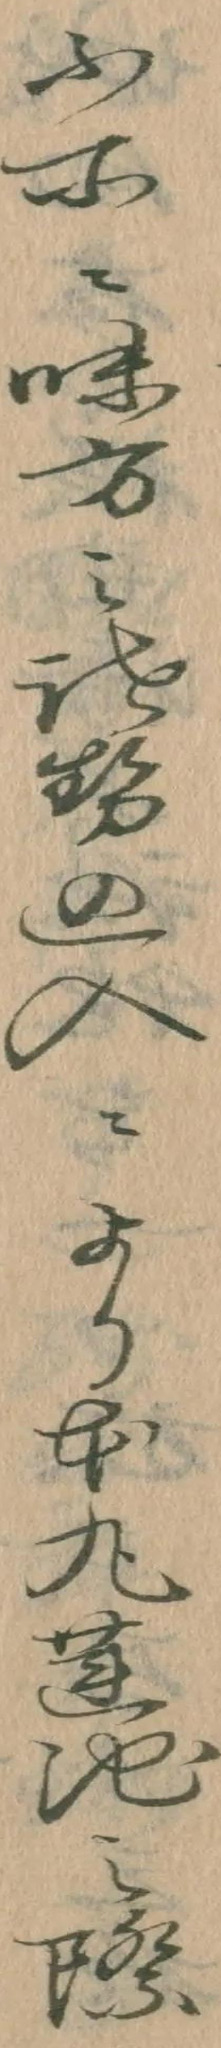ふ所に味方之諸勢込入により本丸蓮池の際
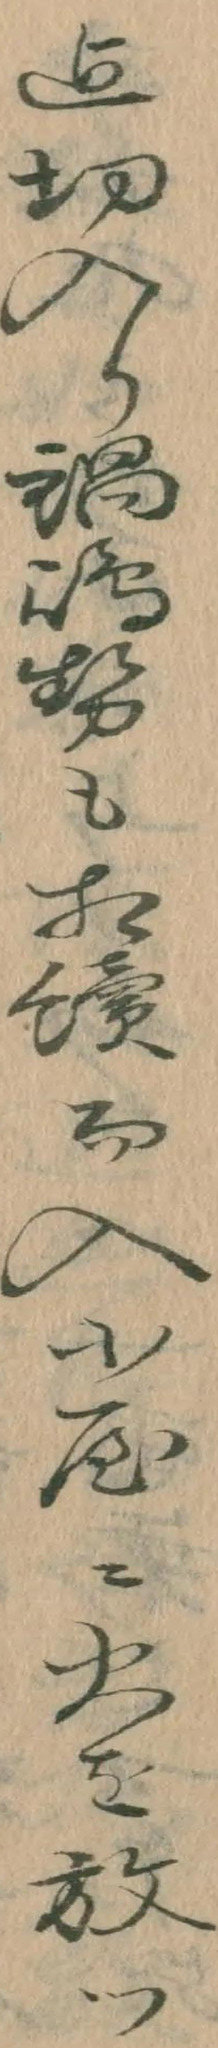迄切入り鍋島勢も相続而入小屋に火を放つ
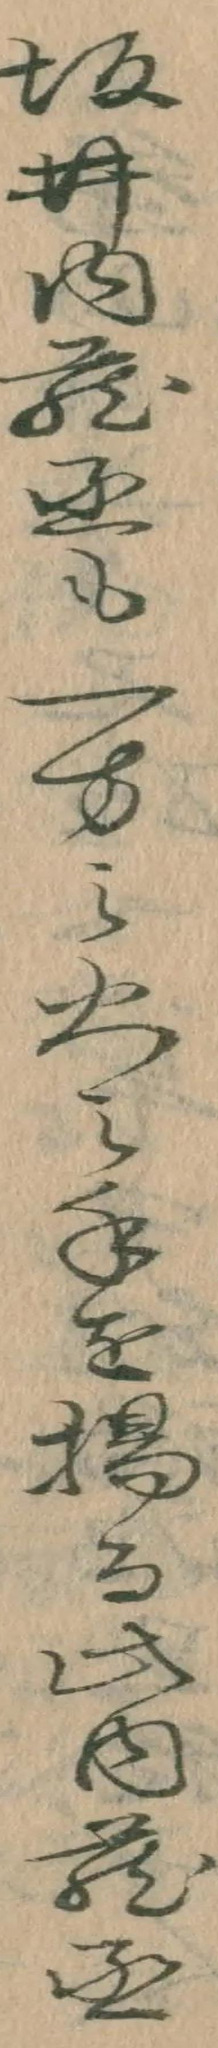坂井内蔵丞も一方之火之手を揚る此内蔵丞
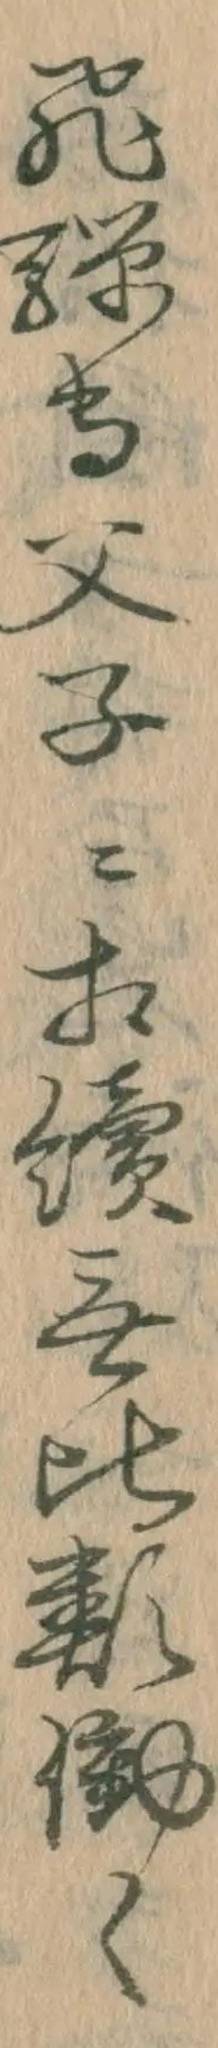飛騨守父子に相続無比類働く
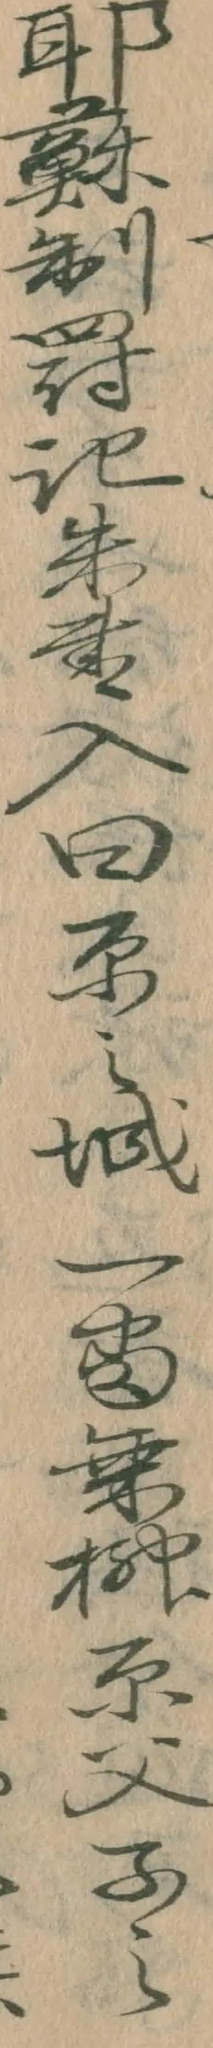耶蘇制罸記朱書入曰原之城一番乗榊原父子之
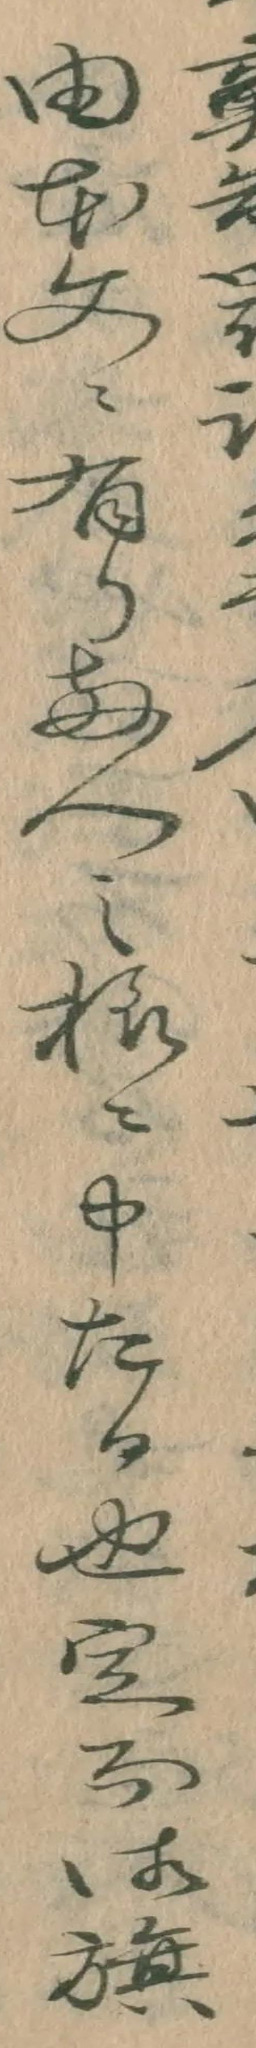由本文に有り両人之様に申たる也定而御旗
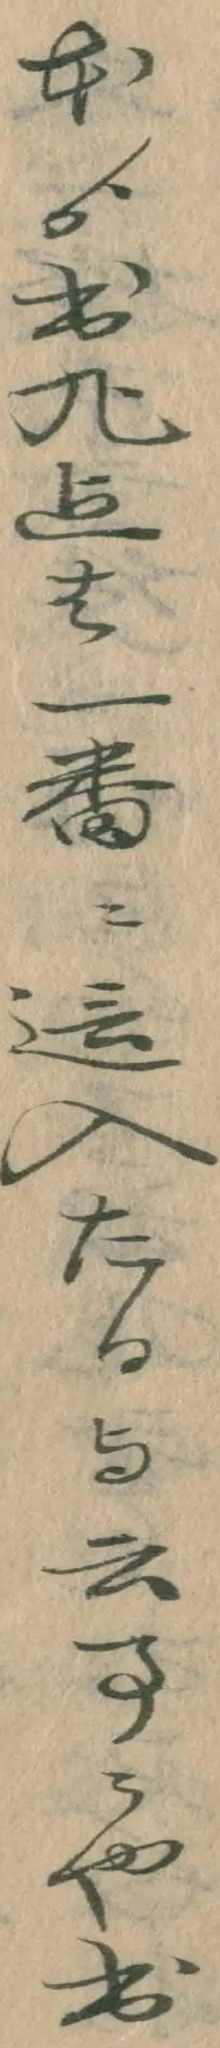本ゟ出丸迄者一番に這入たる与云事にや出
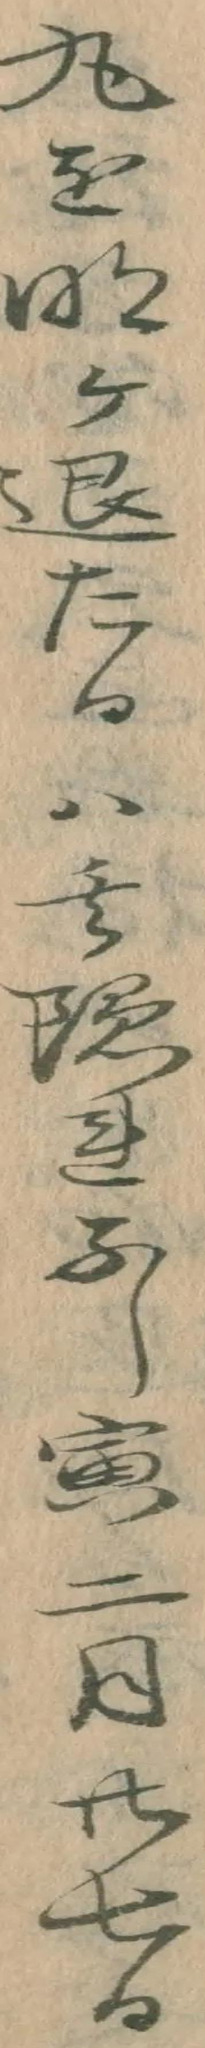丸を明け退たるは其隠連なし寅二月廿七日
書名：切支丹御退治記 49巻. [7]
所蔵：国立国会図書館 National Diet Library, JAPAN
